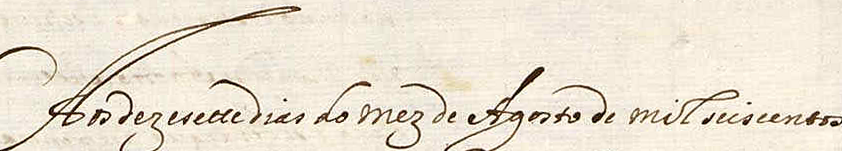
Aos dezesette dias do mez de Agosto de mil seiscentos
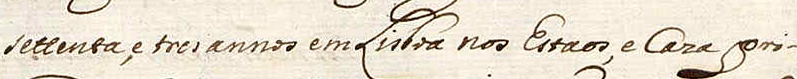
settenta, e tres annos em Lisboa nos Estaos, e Caza pri
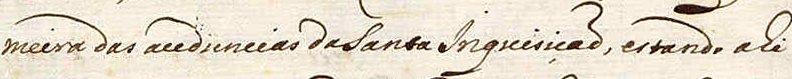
meira das audiencias da Santa Jnquisiçaõ, estando ahi
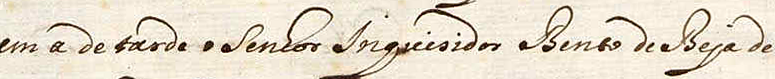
em a de tarde o Senhor Jnquisidor Bento de Beja de
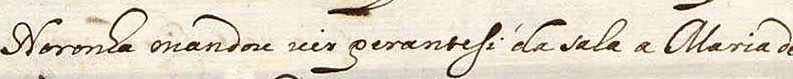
Noronha mandou vir perante si da sala a Maria de
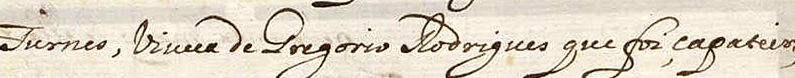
Turnes, viuua de Gregorio Rodrigues que foi çapateiro
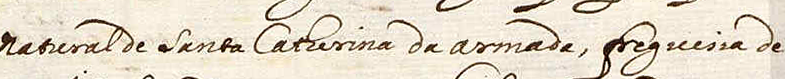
natural de Santa Catherina da armada, freguesia de
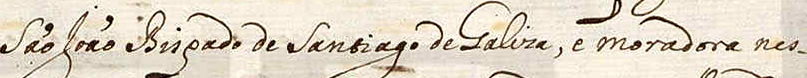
São João Bispado de Santiago de Galiza, e moradora nes
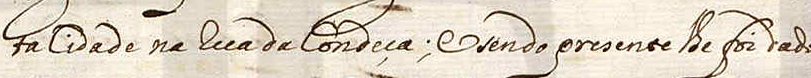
ta Cidade da Rua da Condeça; e sendo presente lhe foi dado
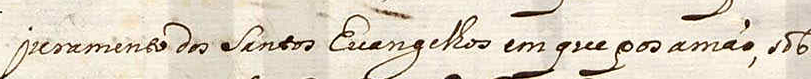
juramento dos Santos Euangelhos em que pos a mão, sob
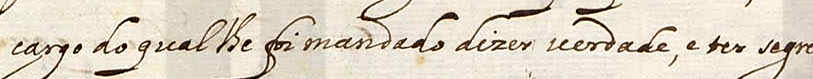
cargo do qual lhe foi mandado dizer verdade, e ter segre
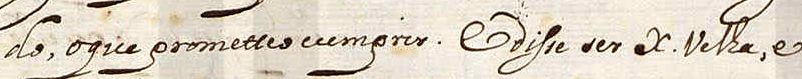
do, o que prometteo cumprir. E disse ser x. velha, e
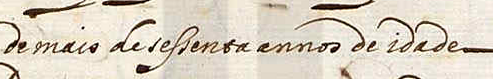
de mais de sessenta annos de idade
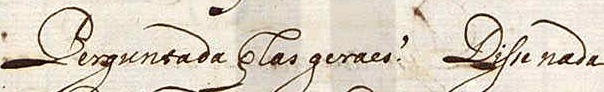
Perguntada plas geraes? Disse nada
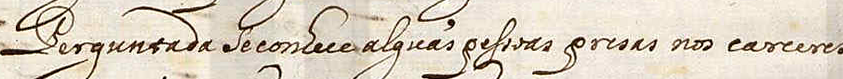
Perguntada se conhece alguās pessoas presas nos carceres
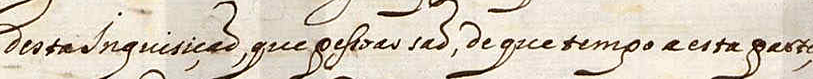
desta Jnquisiçaõ, que pessoas saõ, de que tempo a esta parte,
